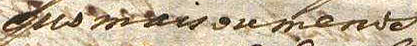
quo mais ou menos
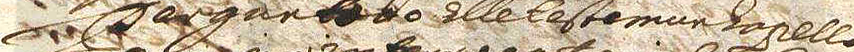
Perguntado elle testemunha pello
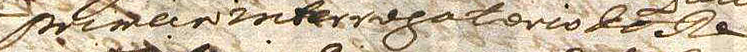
primeiro interrogatorio da Re
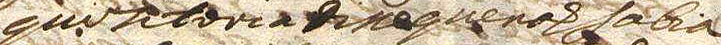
quizitoria disse que naõ sabia
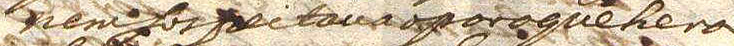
nem sospeitaua o para que hera
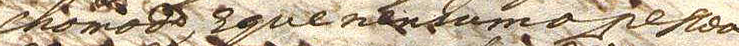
chamado, E que nenhuma pessoa
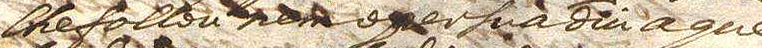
lhe fallou nem o persuadiu a que
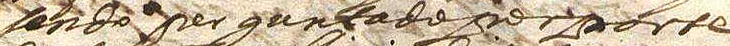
sendo perguntado por parte
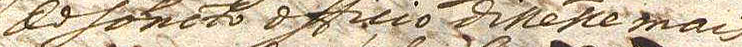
do sancto offiçio dissesse mais
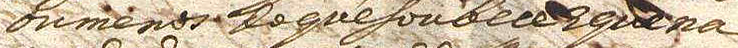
ou menos do que soubece E que na
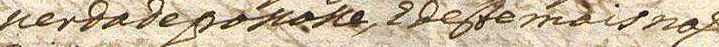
uerdade passasse, E deste mais naõ
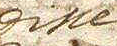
disse
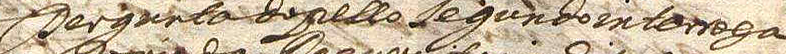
Perguntado pello segundo interroga
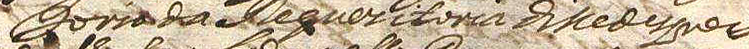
torio da Requezitoria disse despois
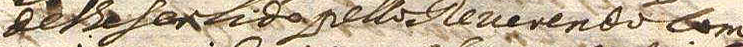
de lhe ser lido pello Reuerendo Com
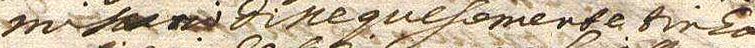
missario disse que somente tinha
